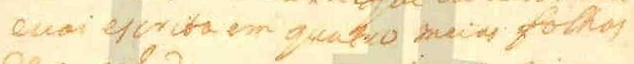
e uai escrita em quatro meias folhas
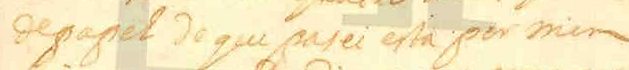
de papel de que pasei esta por mim
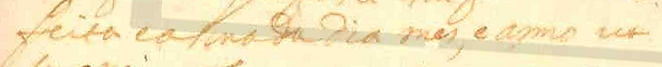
feita e asinada dia mes, e anno ut
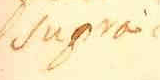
supra
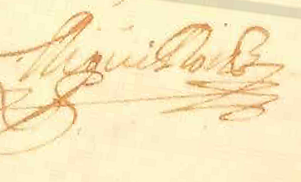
Miguel Roiz̄
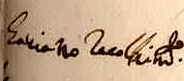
hauia no Recolhimto.
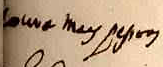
oura mais pessoas
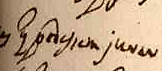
q̄ podessem jurar
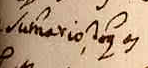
sumario, do q̄ as
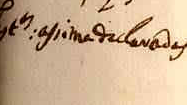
t.as assima declaradas
